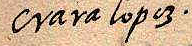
crara lopez.
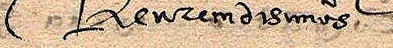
Reueremdisimo sor
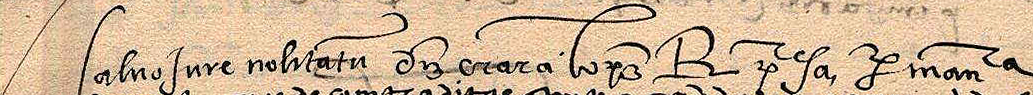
Saluo Jure nolitātu dīz crara lop̄z R presa ꝑ manra
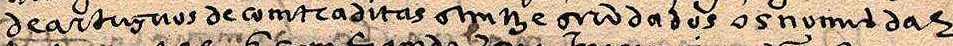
de artriguos de comtraditas sem lhe serē dados os nomes das
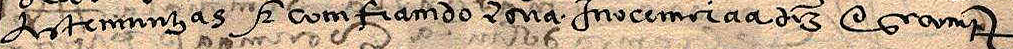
testemunhas e comfiamdo ē sua. Jnocemciaa dīz e se comp̄r
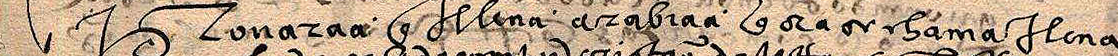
Prouaraa q̄ Jllena arabiaa q̄ ora se chama Jlena
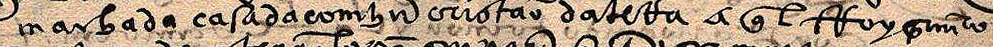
machada casada com hū cristaõ da teRa a q̄l ffoy p̄imro
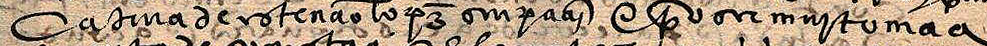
Catiua de esteuão lopz̄ seu paaj̄ e p̄o ser mujto maa
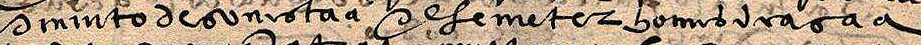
e muito desonestaa e lhe meter homes ē casaa
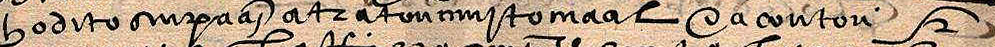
ho dito seu paaj̄ a tratou mujto maaL e acoutou e
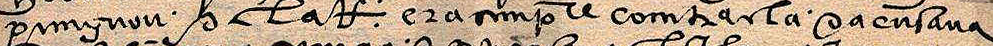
pimguou e ela R. era sempre comtra ela e acusaua
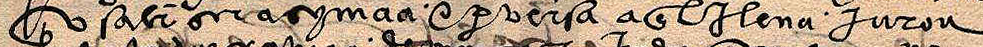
p̄o sabr̄ ser asy maa e ꝑversa a q̄l Jlena Jurou
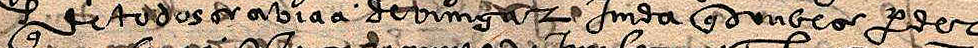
q̄ de todos se aviaa de vimgar Jmda q̄ soubese ꝑder
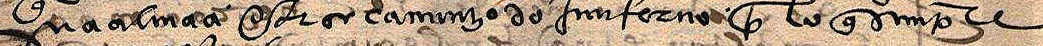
sua almaa e Jr se caminho do Jnnferno p̄lo q̄ sempre
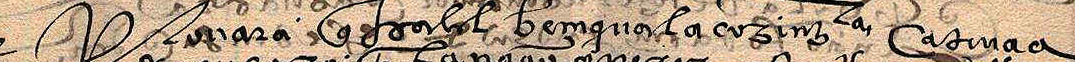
Prouara q̄ Jsabel bemquala cozinhra Catiuaa
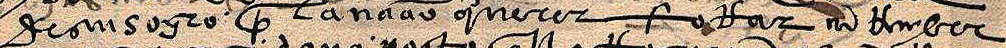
de seu sogro p̄la naão querer foRar nē Reçeber
